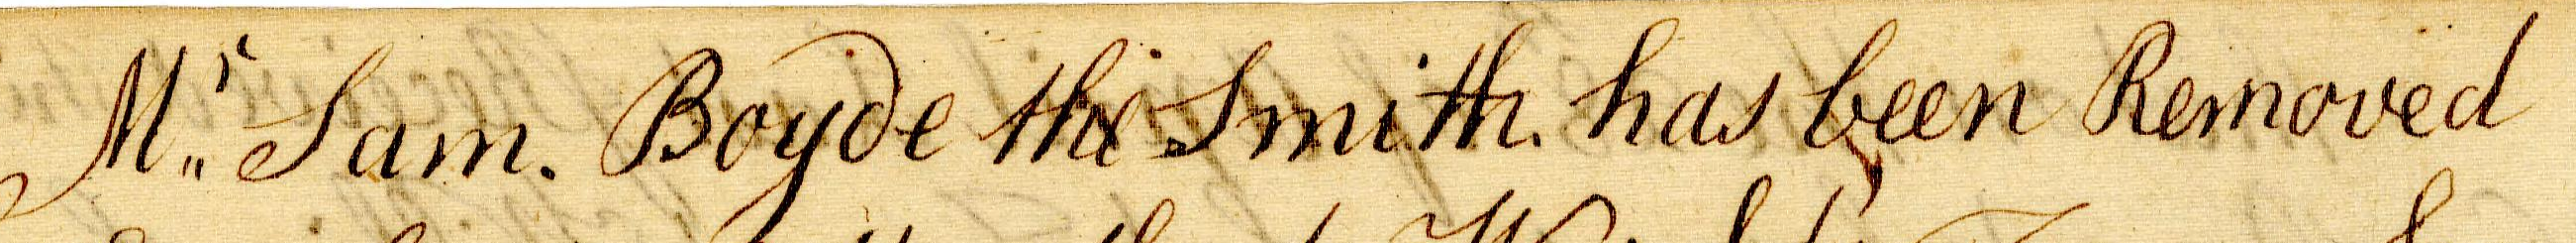M^r,, Sam. Boyde the Smith has been Removed
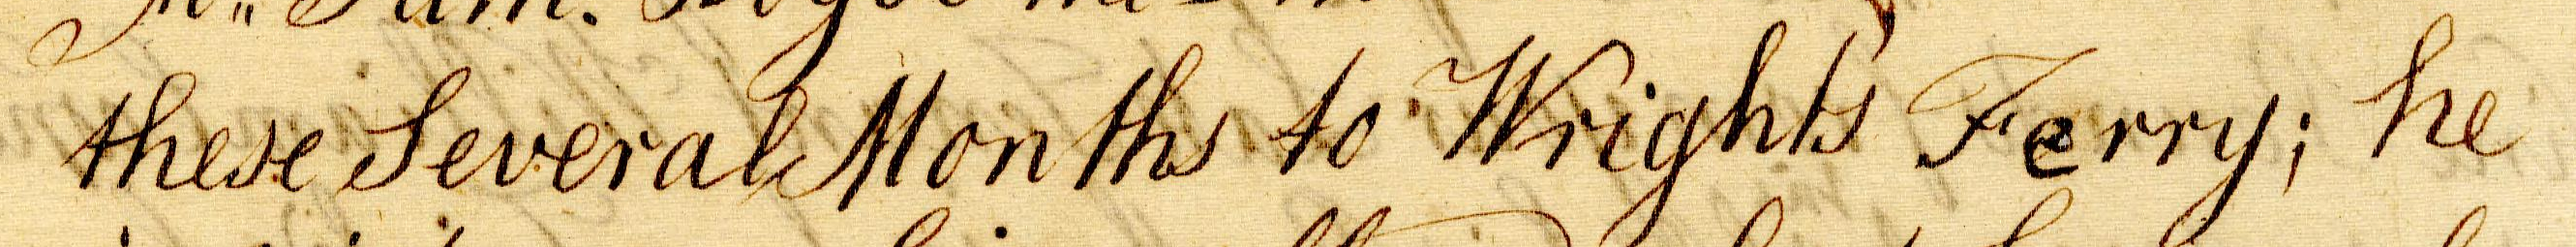these Several Months to Wright's Ferry; he
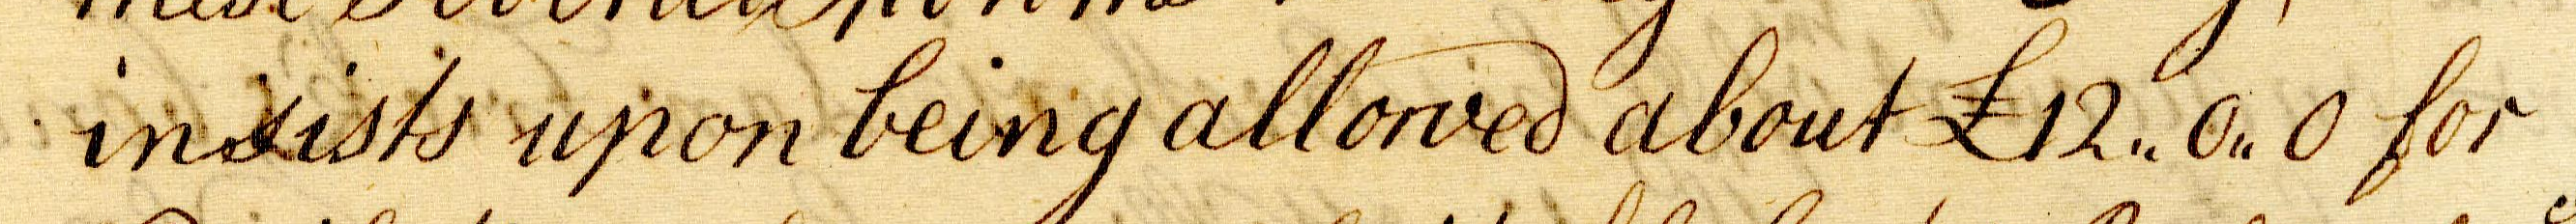insists upon being allowed about £12..0..0 for
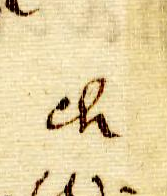ch
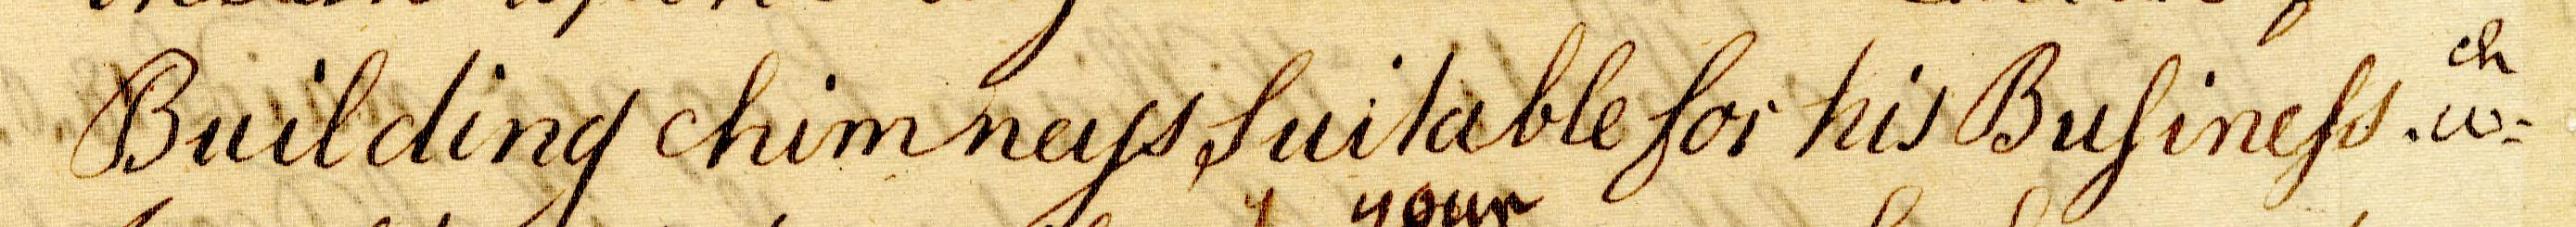Building chimneys Suitable for his Business. w-
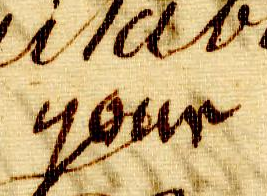your
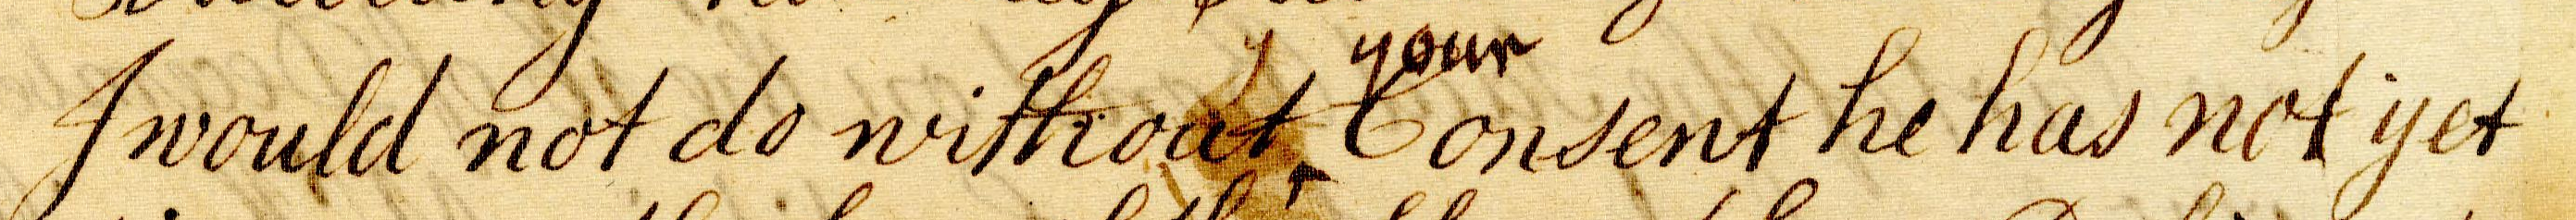I would not do without ^ Consent he has not yet
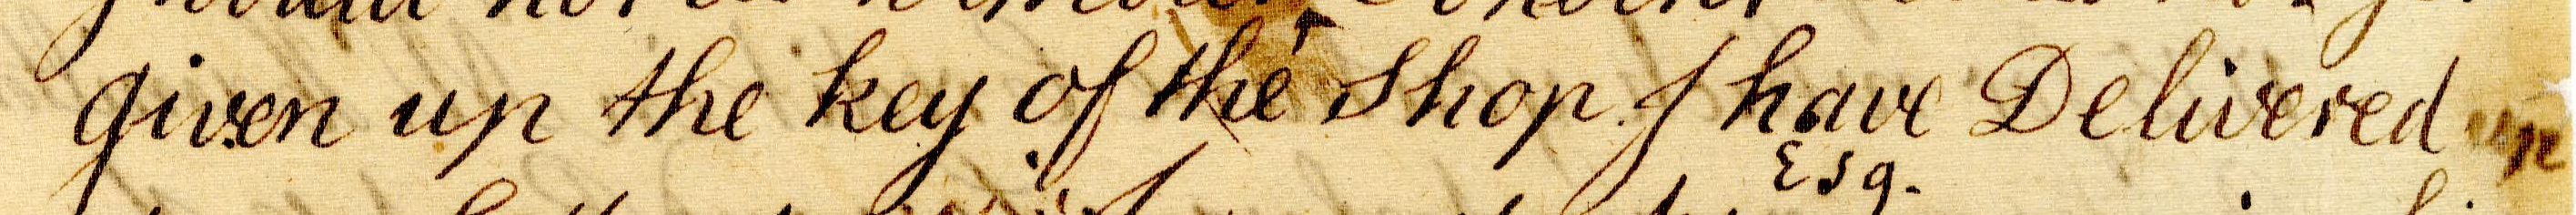given up the key of the shop. I have Delivered [up]
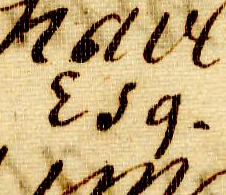Esq.
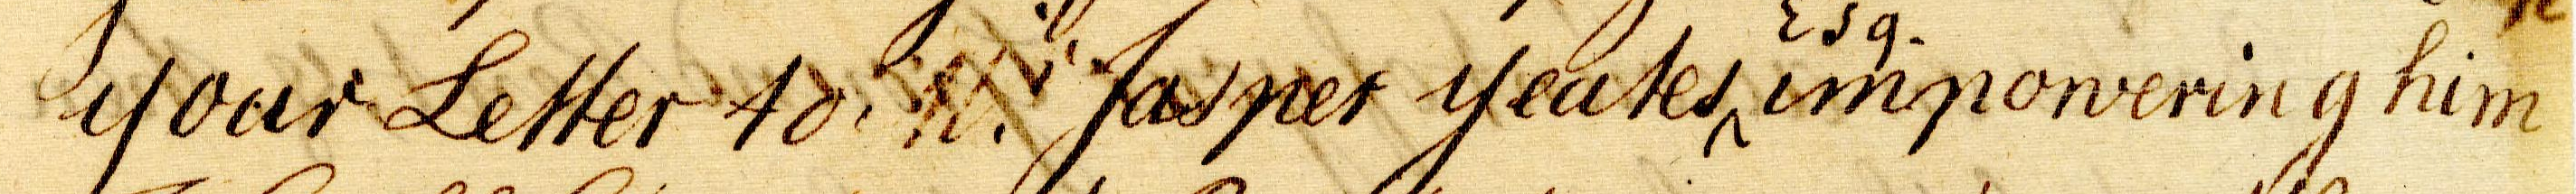your Letter fo M^r. Jasper Yeates ^ impowering him
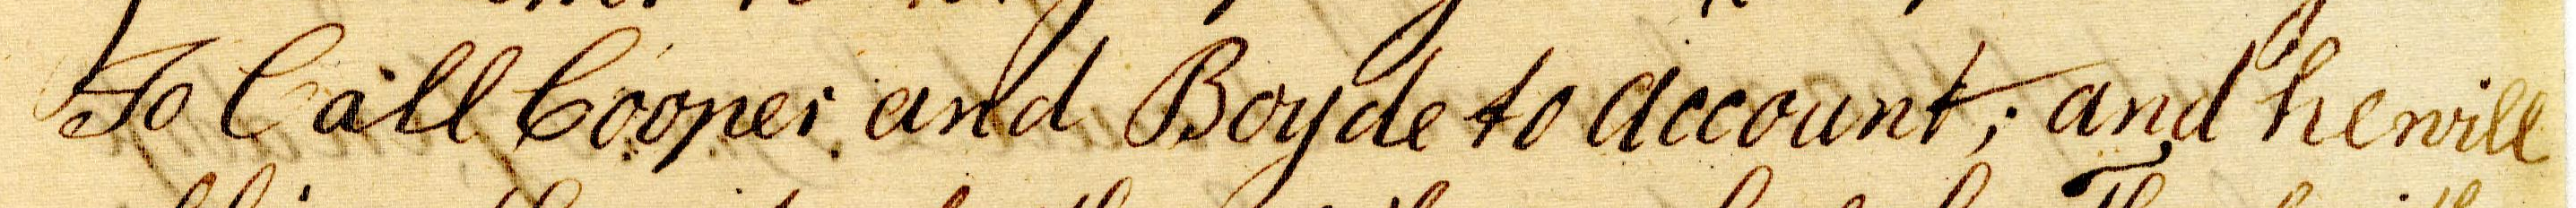To Call Cooper and Boyde to Account; and he will
